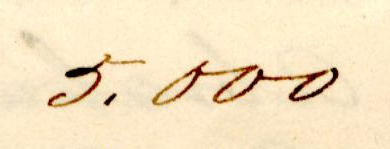5.000
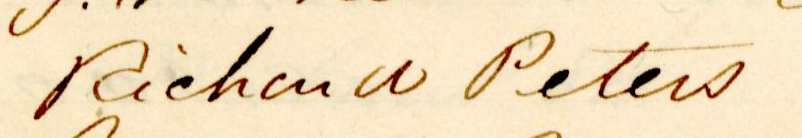Richard Peters
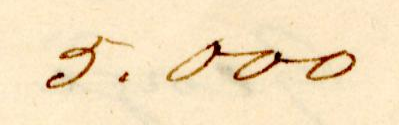5,000
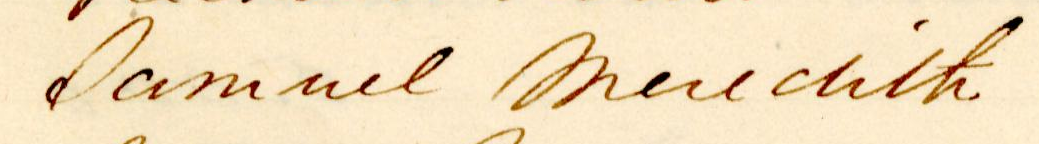Samuel Meredith
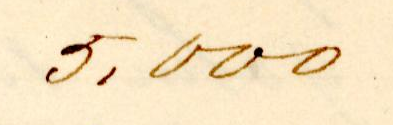5,000
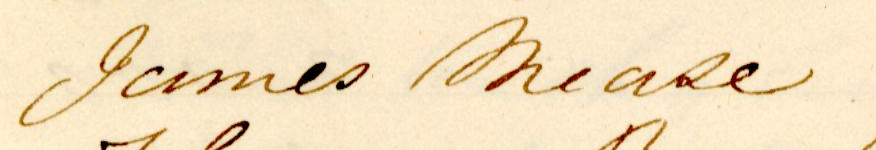James Mease
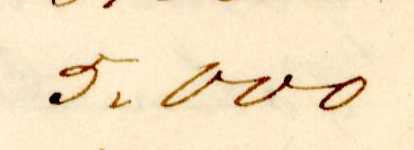5,000
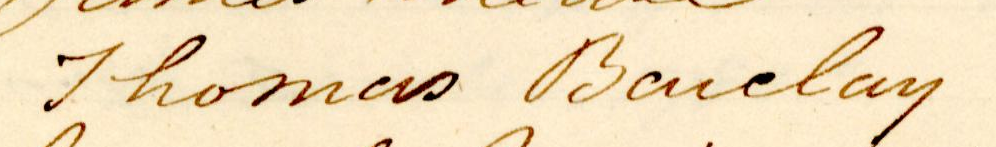Thomas Barclay
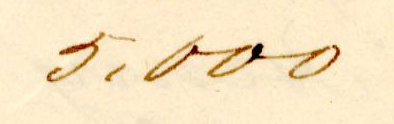5,000
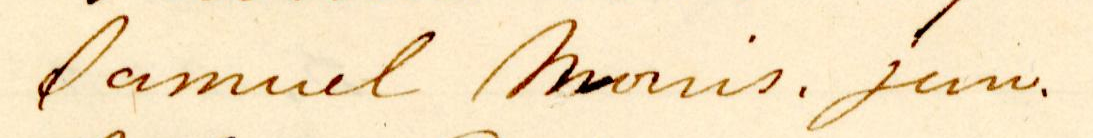Samuel Morris. Jun
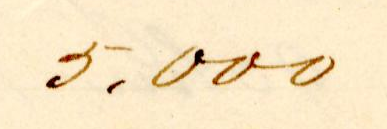5,000
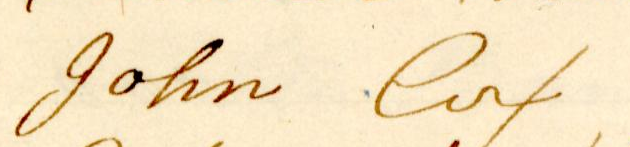John Cox
